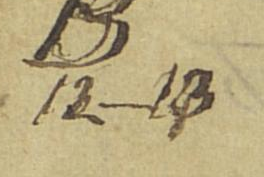12-13
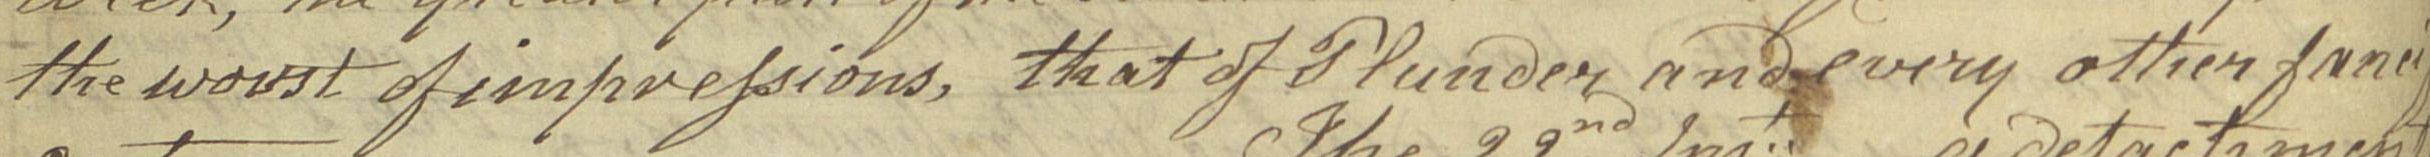the worst of impressions, that of Plunder and every other fanci-
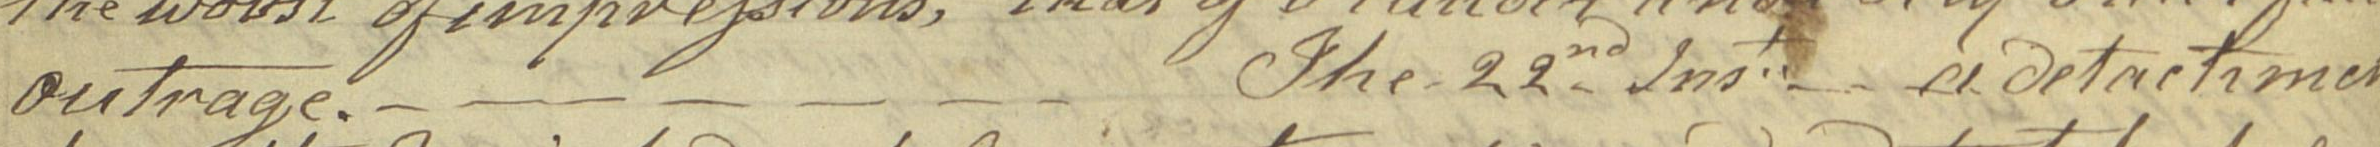outrage. The 22.^nd. Ins^t- a detachment
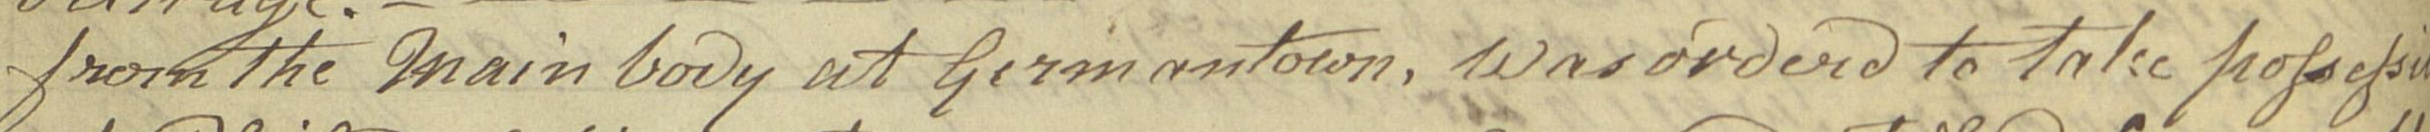from the Main body at Germantown, was orderd to take possession
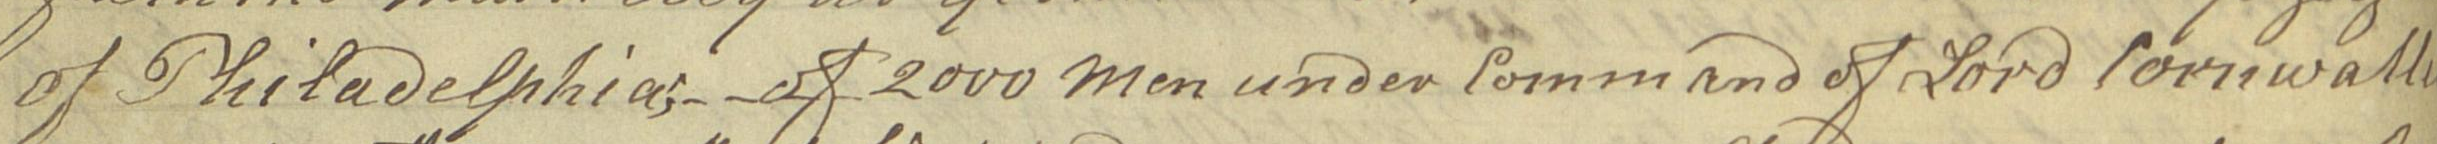of Philadelphia; of 2000 Men under Command of Lord Cornwallis
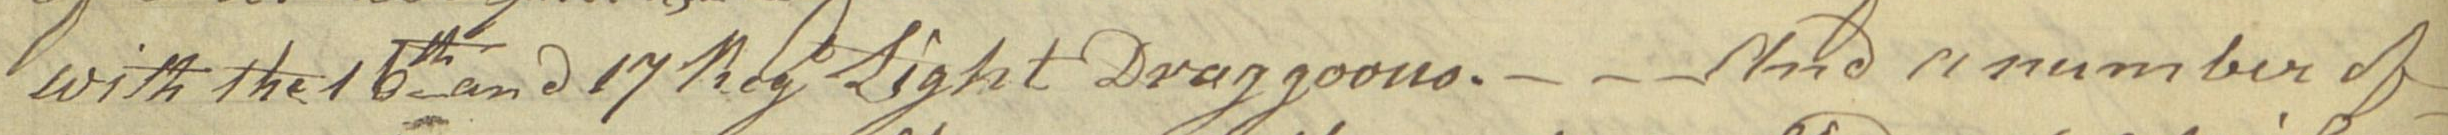with the 16^th and 17 Reg^r Light Draggoons. And a number of
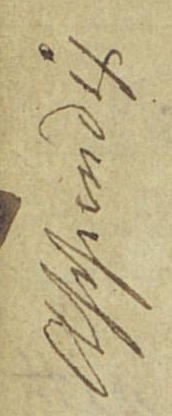Appendix
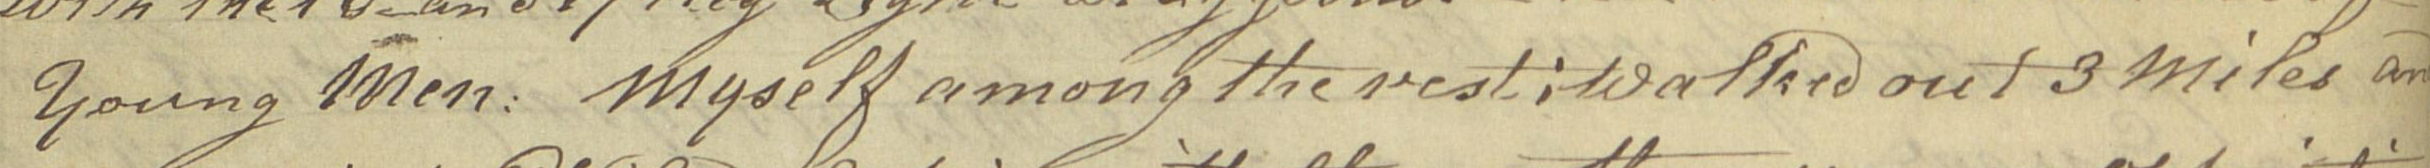Young Men: myself among the rest; walked out 3 Miles and
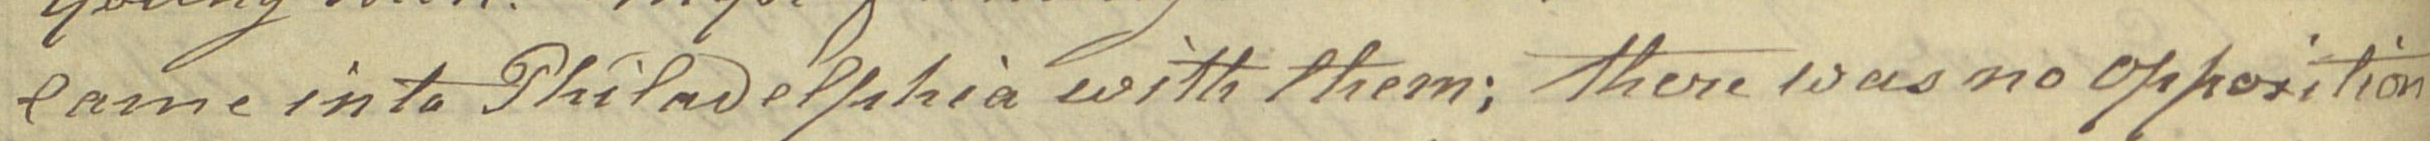came in to Philadelphia with them; there was no opposition
